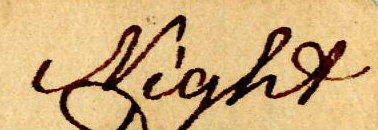Night
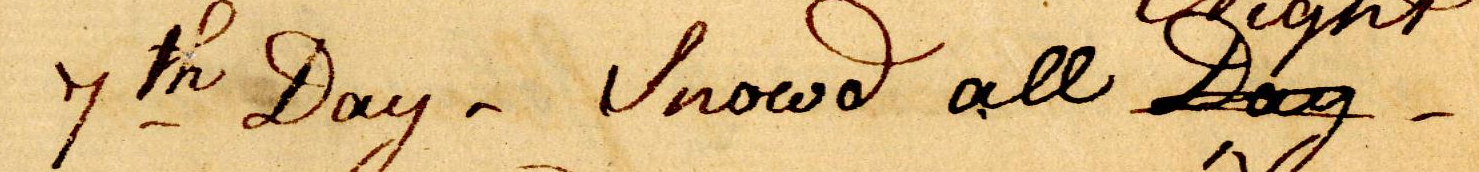7^th Day- Snowd all [Day] ^-
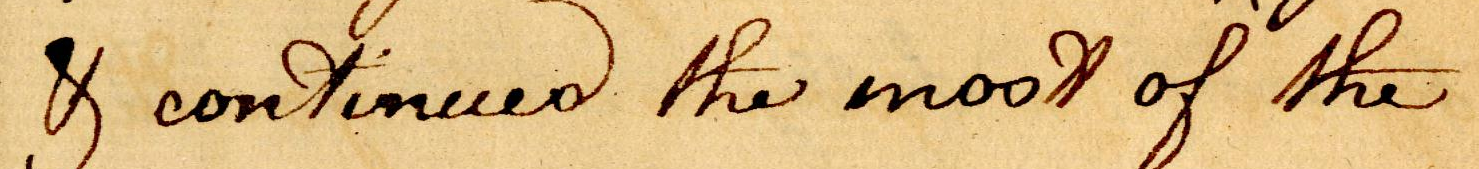& continued the most of the
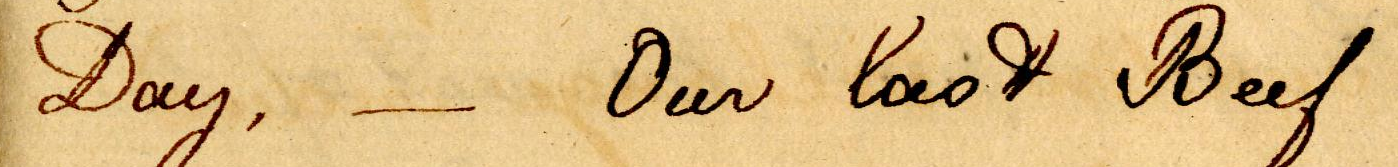Day.- Our last Beef
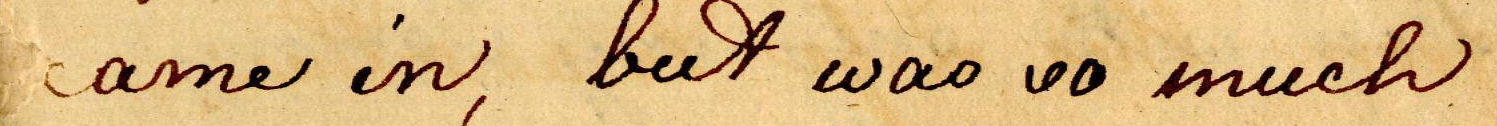came in, but was so much
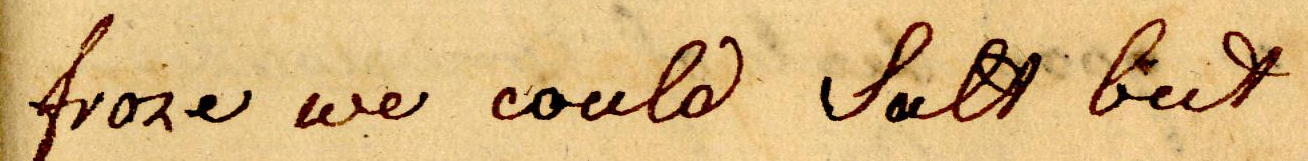froze we could Salt but
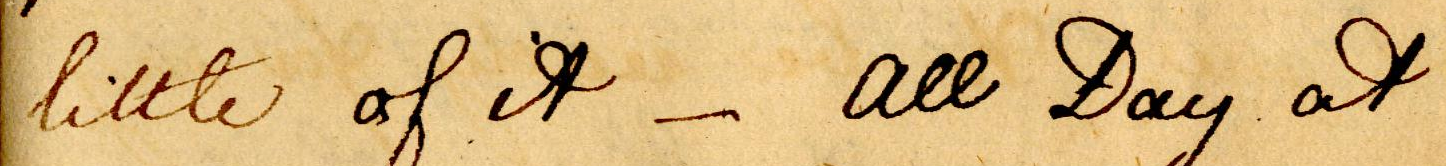little of it- All Day at
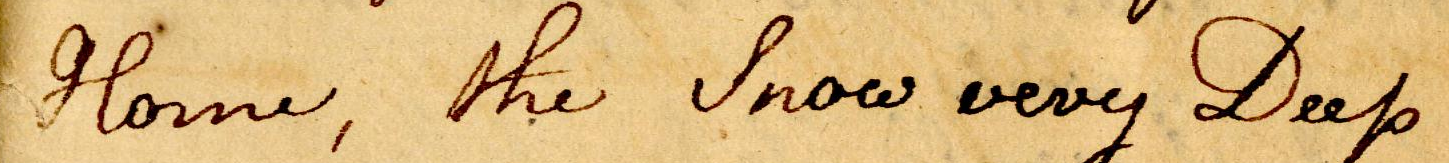Home, the Snow very Deep
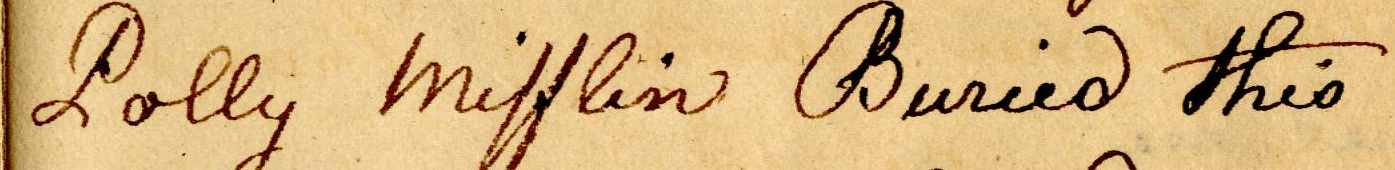Polly Mifflin Buried this
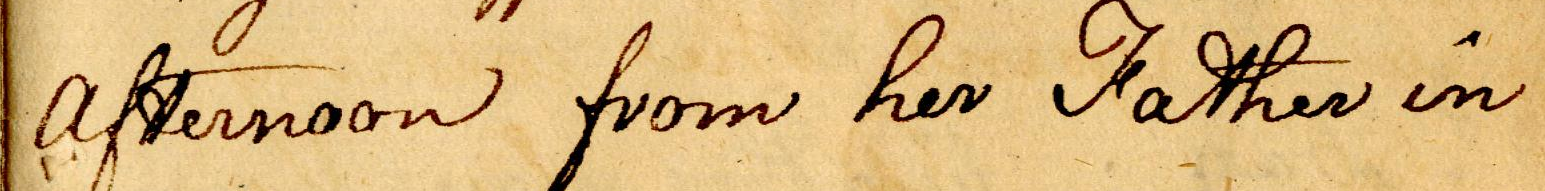Afternoon from her Father in
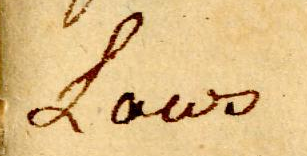Laws-
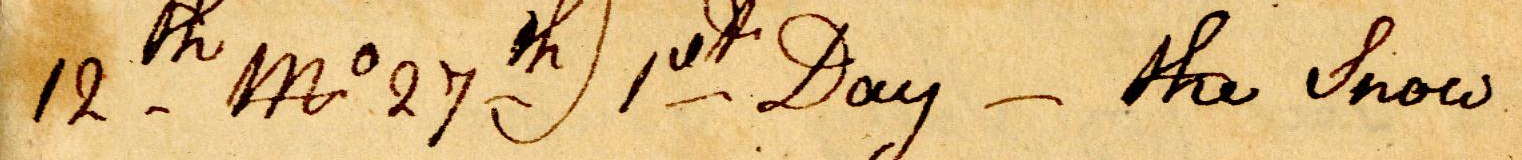12^th M^o 27^th) 1^st Day- the Snow
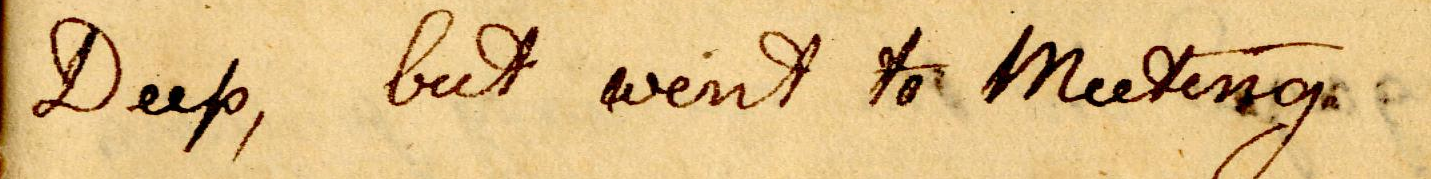Deep, but went to Meeting
